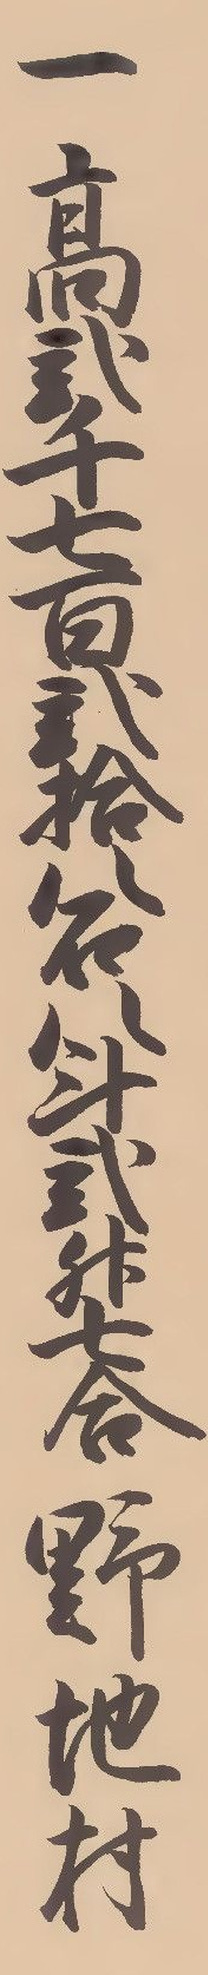一髙弐千七百弐拾八石八斗弐升七合野地村
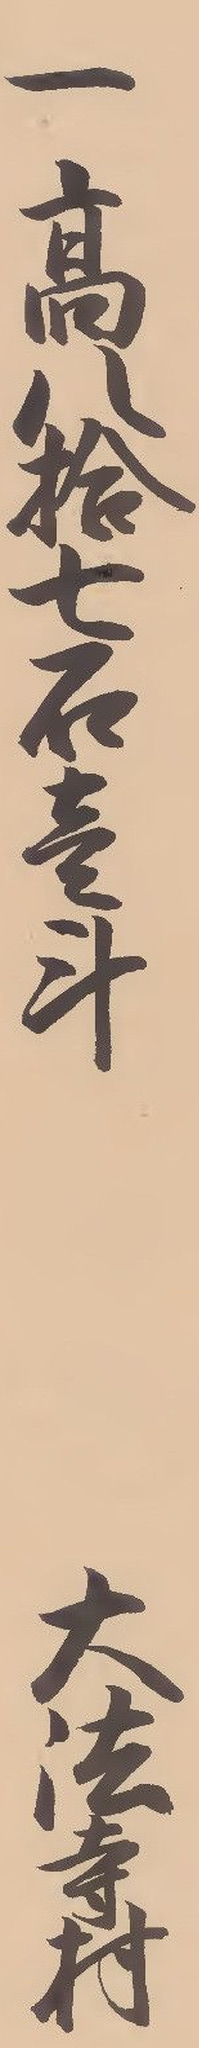一髙八拾七石壱斗大法寺村

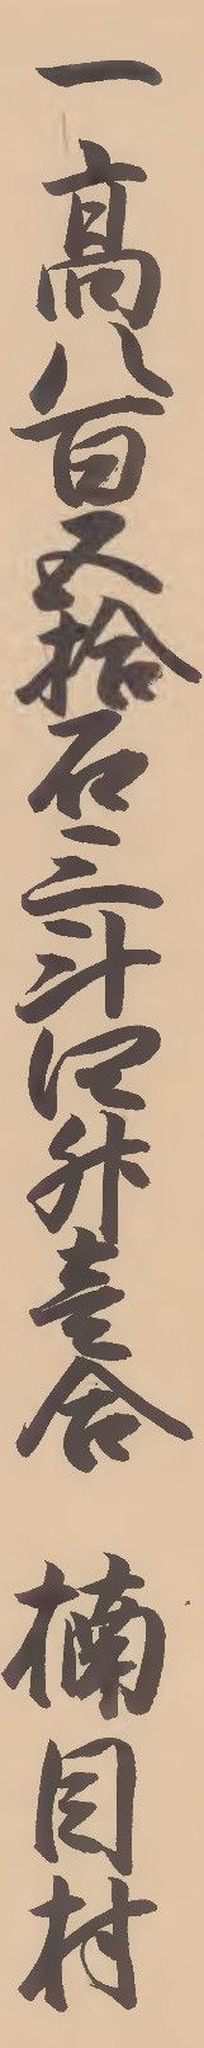一髙八百五拾石三斗四升壱合楠目村
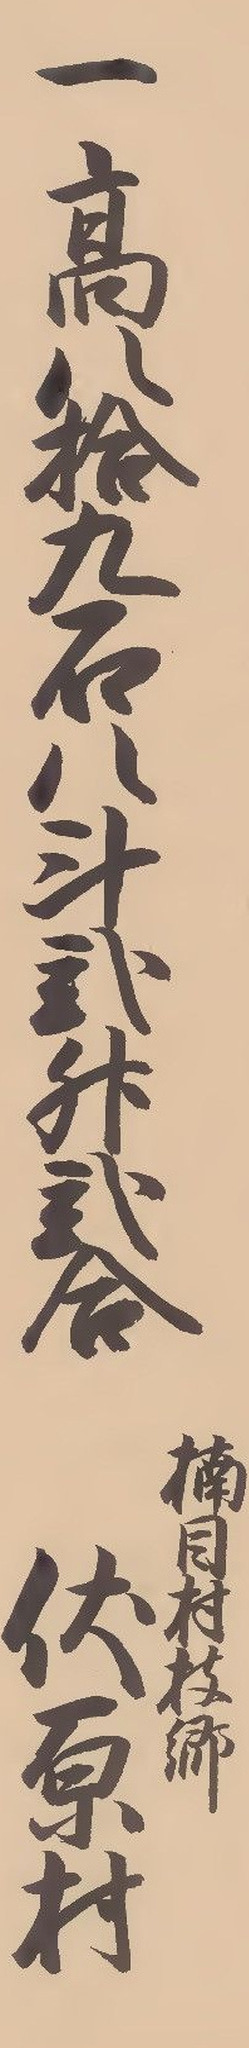一髙八拾九石八斗弐升弐合伏原村
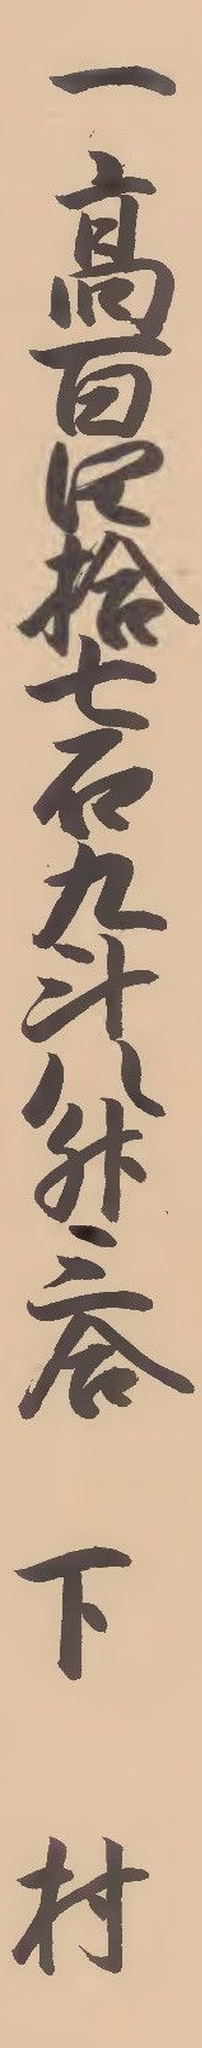一髙百四拾七石九斗八升三合下村
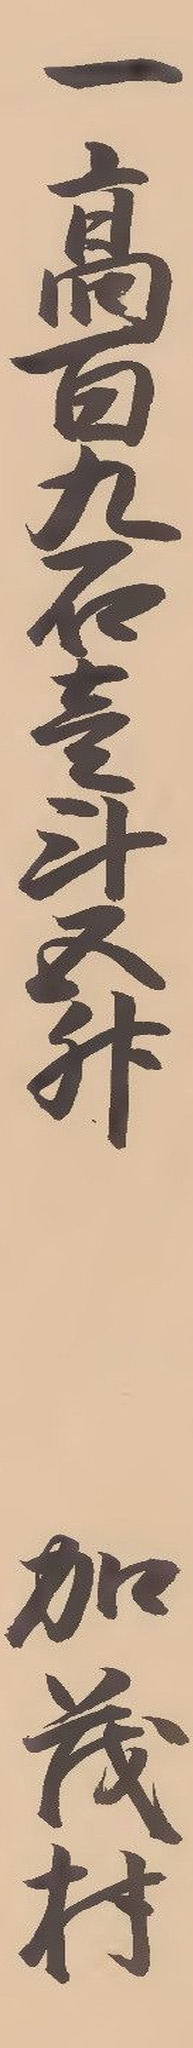一髙百九石壱斗五升加茂村
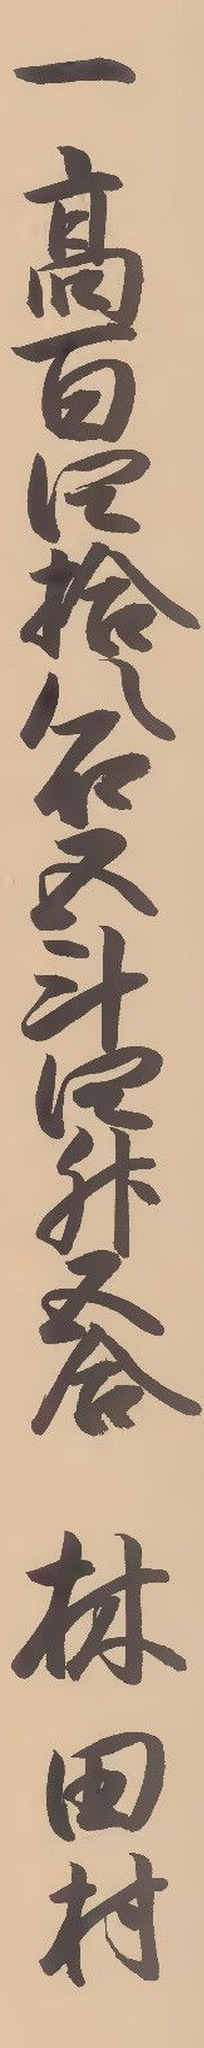一髙百四拾八石五斗四升五合林田村
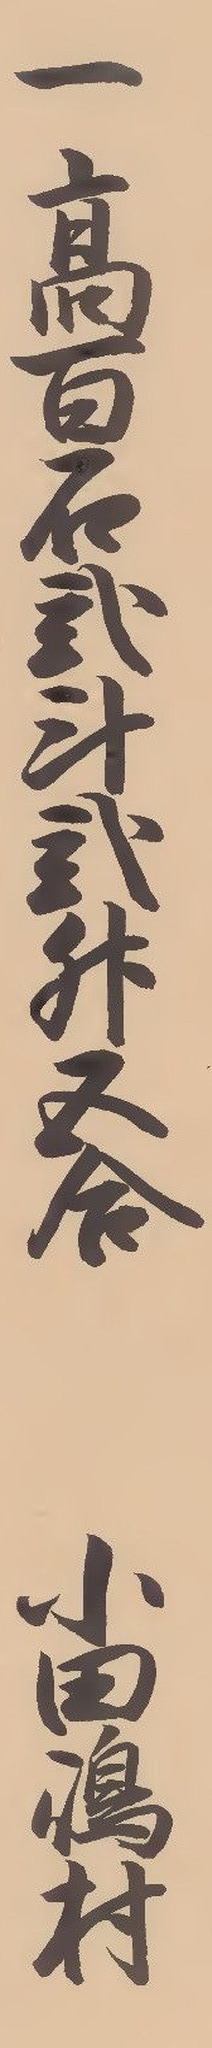一髙百石弐斗弐升五合小田嶋村
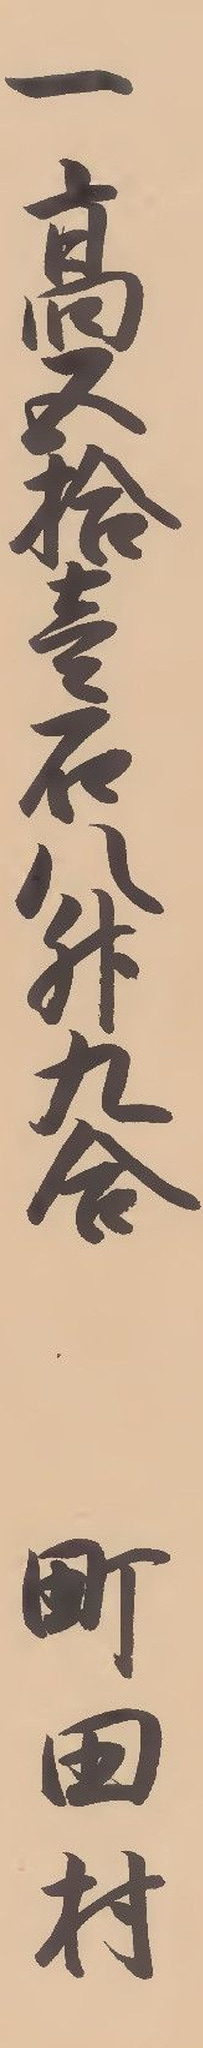一髙五拾壱石八升九合町田村
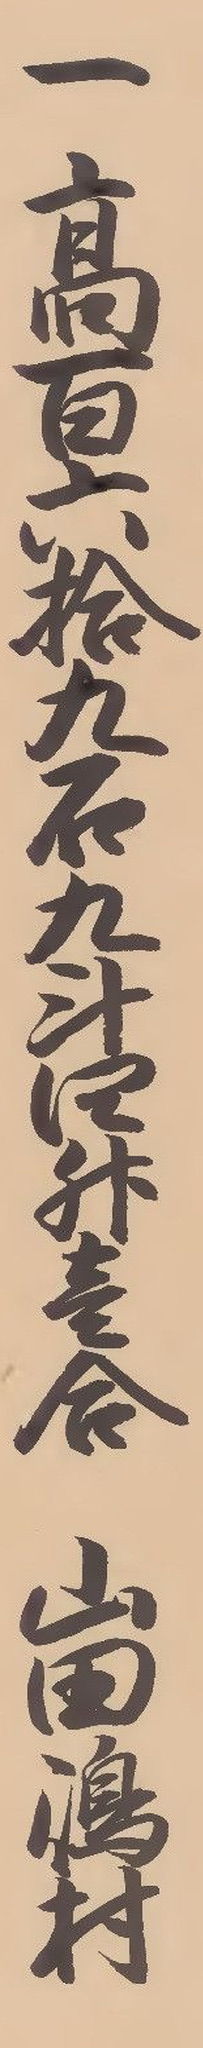一髙百六拾九石九斗四升壱合山田嶋村

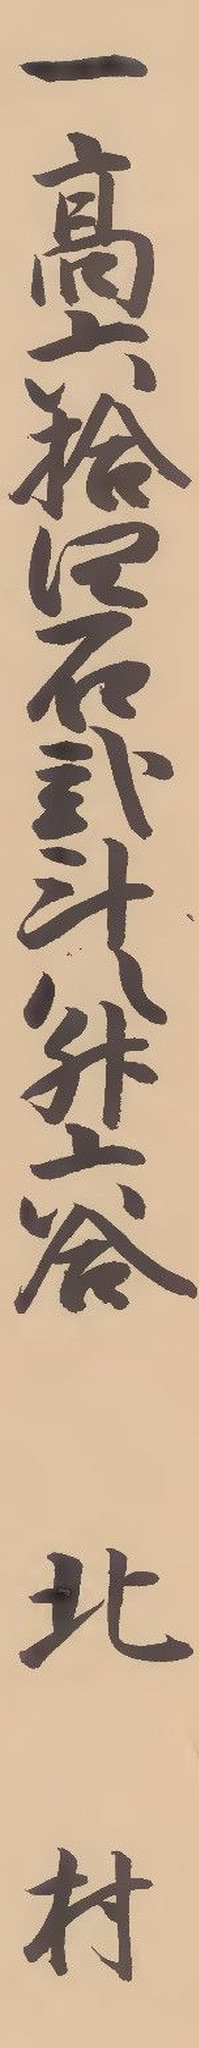一髙六拾四石弐斗八升六合北村
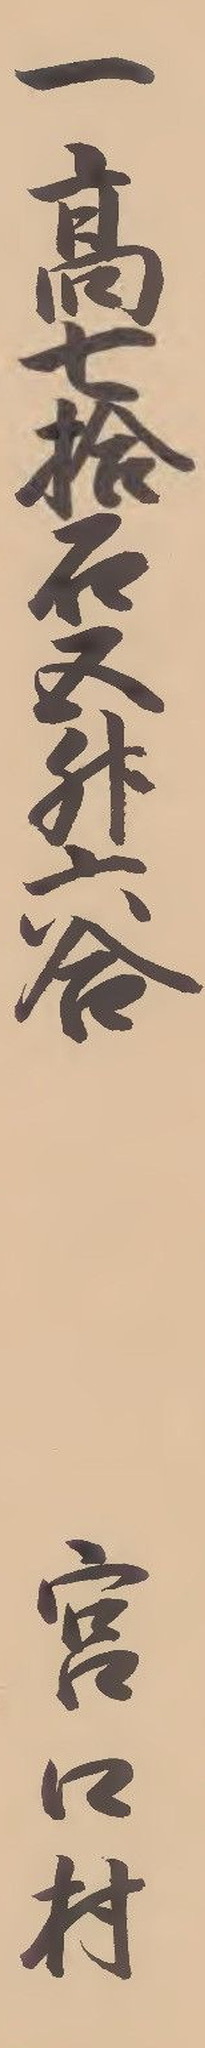一髙七拾石五升六合宮口村
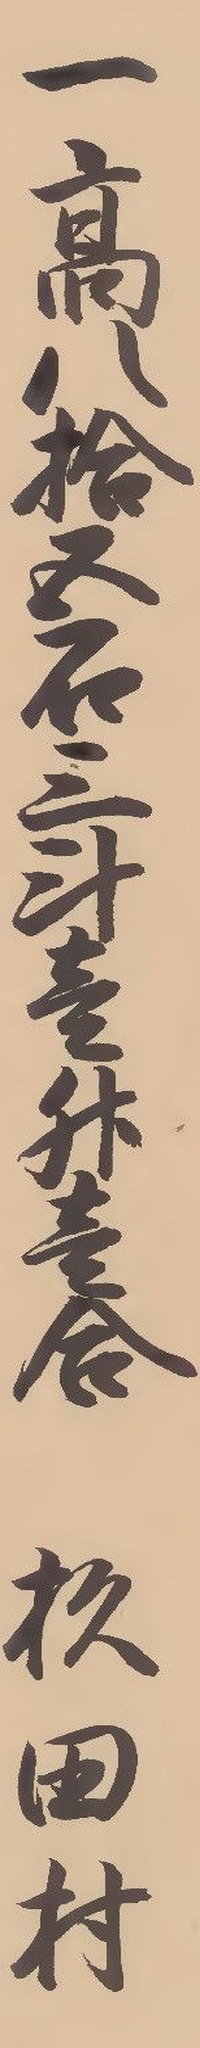一髙八拾五石三斗壱升壱合杦田村
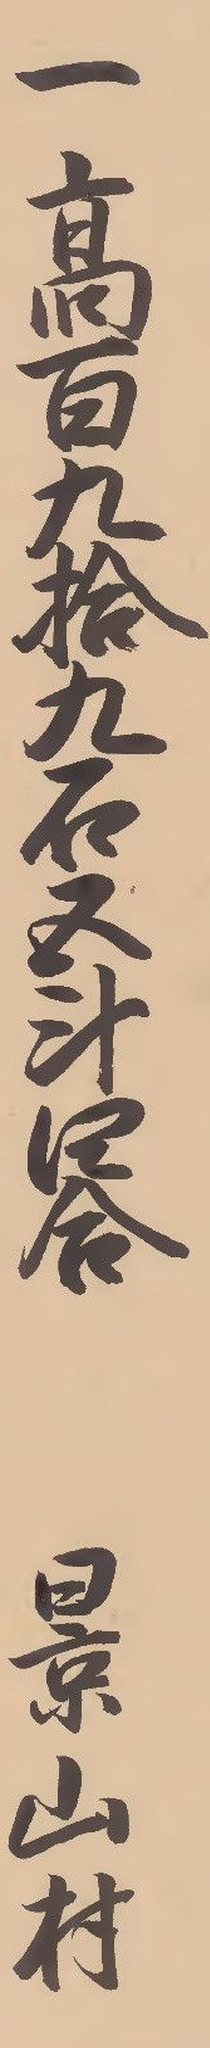一髙百九拾九石五斗四合景山村
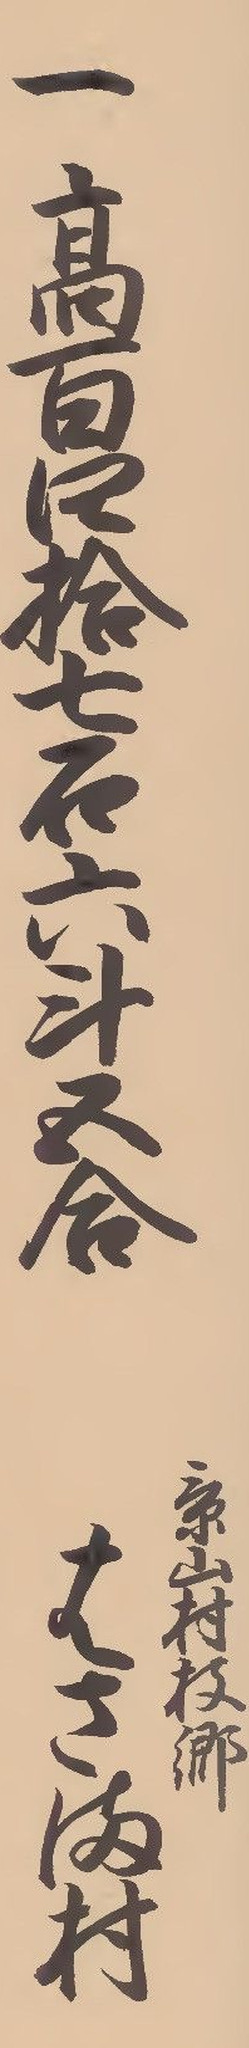一髙百四拾七石六斗五合はさま村
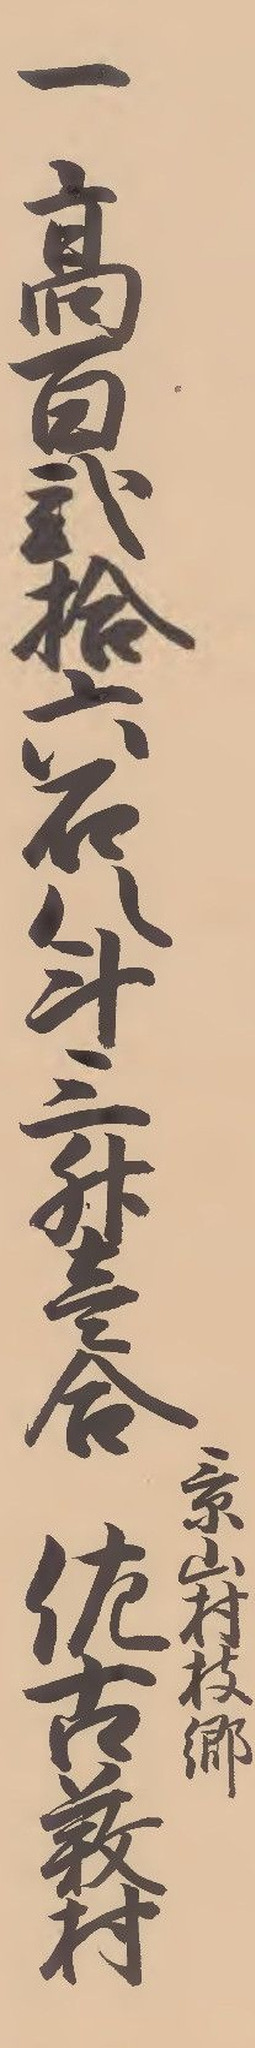一髙百弐拾六石八斗三升壱合佐古藪村
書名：土佐国郷帳
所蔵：国立公文書館 National Archives of Japan
